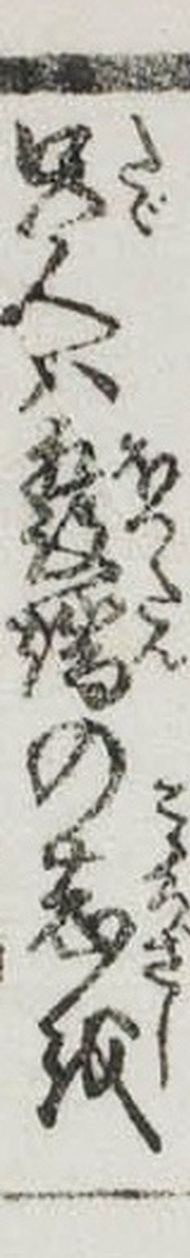只人は発端の志を
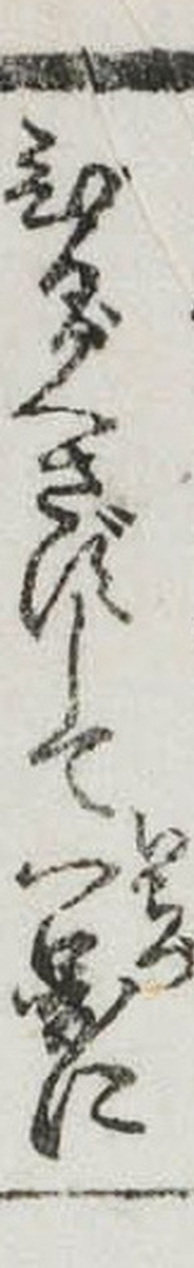ひるがへさずして一図に
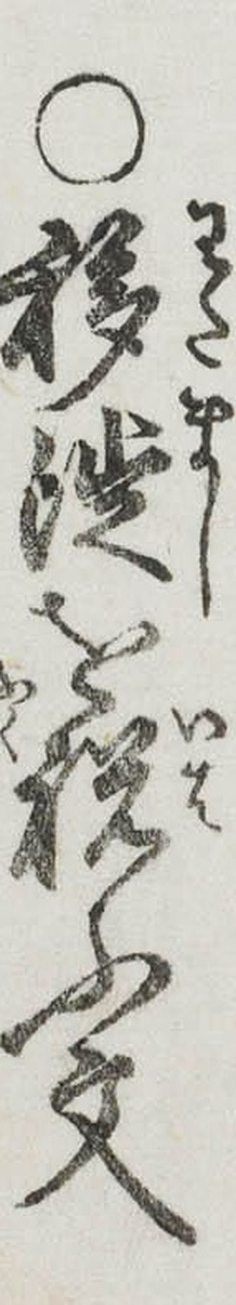○移徙を祝ふ文
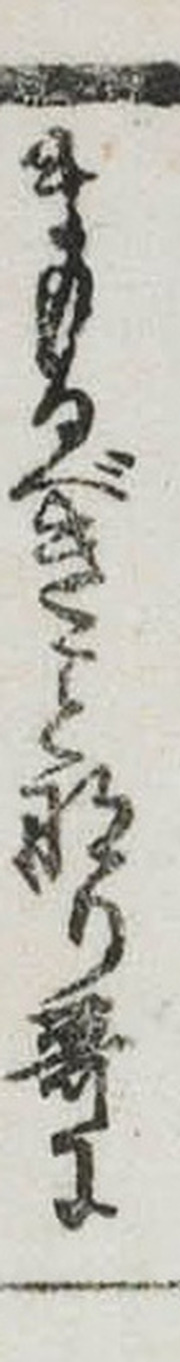まもるべきことなり歌に
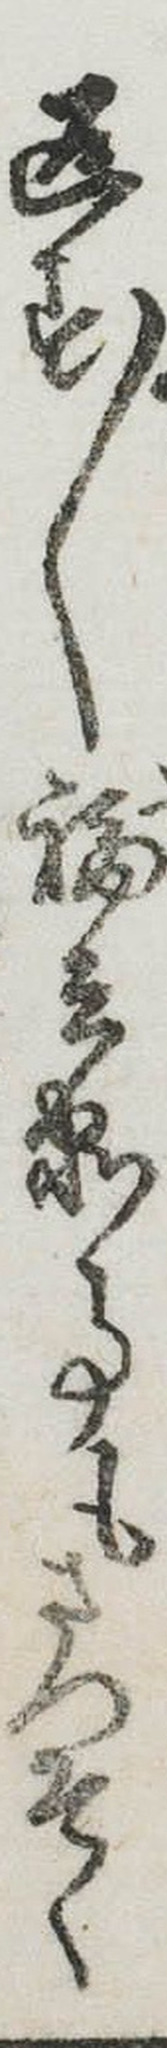返す〳〵福兵衛事もさつそく
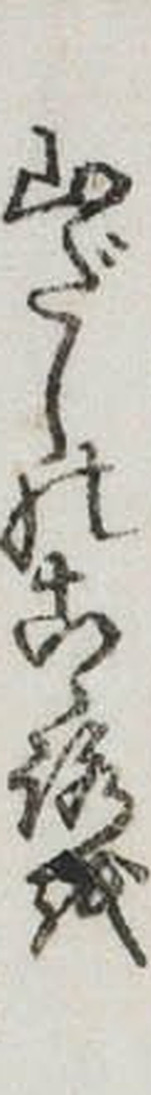山だしのこゝろを
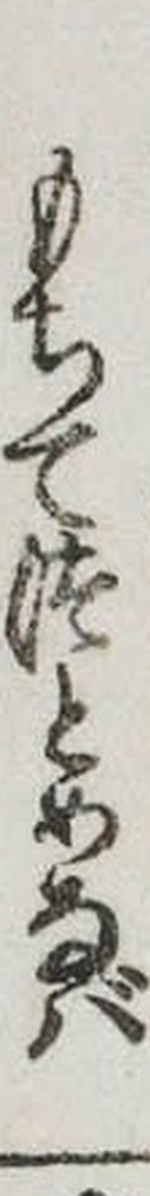もちてつとめなば
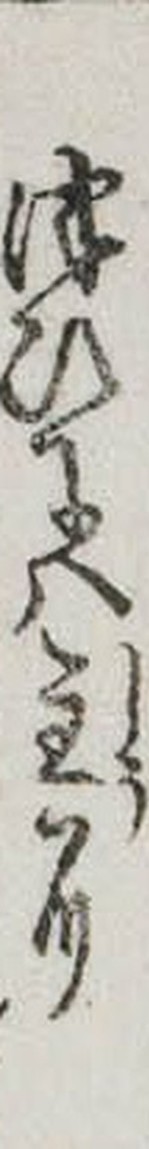つひには主に
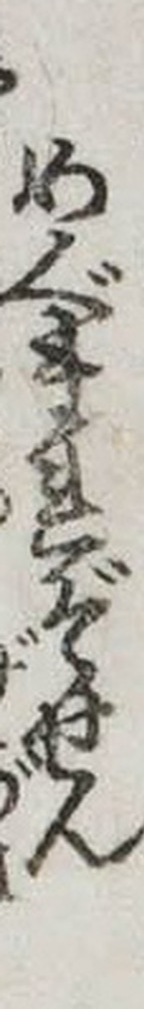めぐまれぞせん
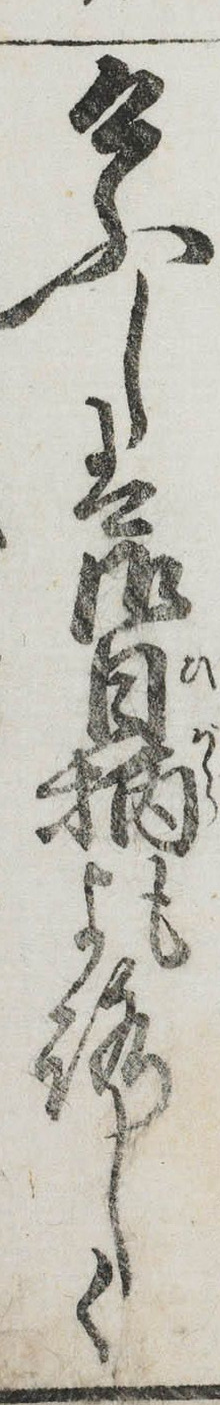けふしは御日柄もよろしく
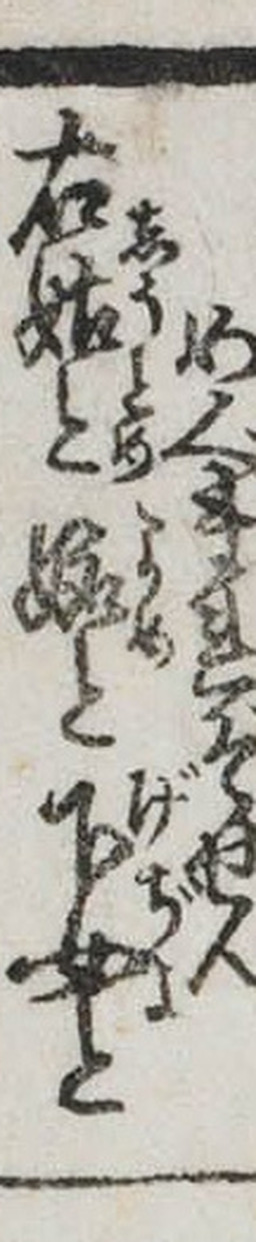右姑と娵と下女と
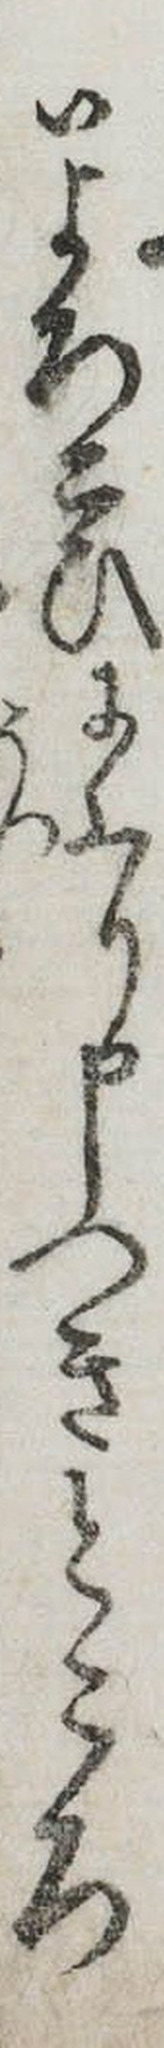御よろこひに上り申へきところ
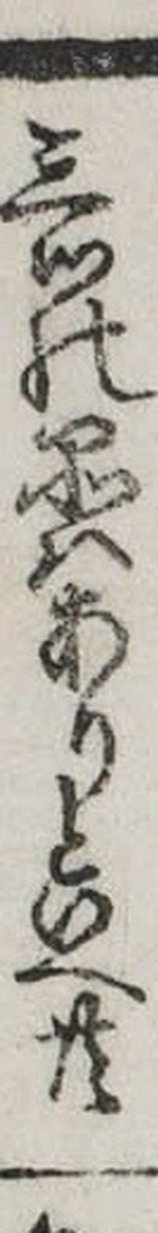三ツの品はありといへ共
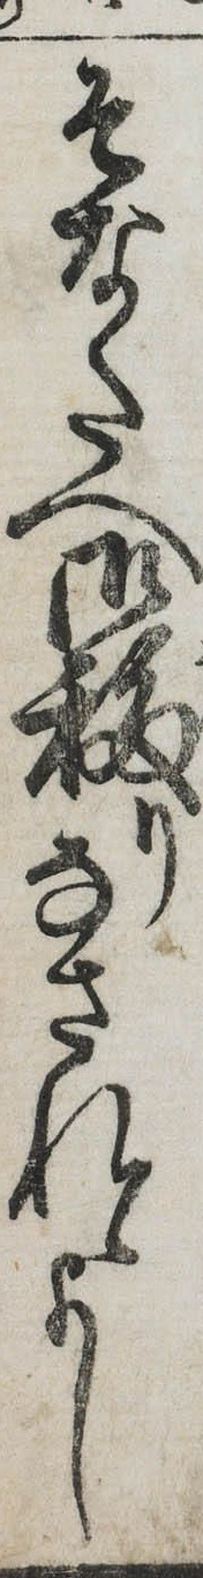そなたへ御移りなされ候よし
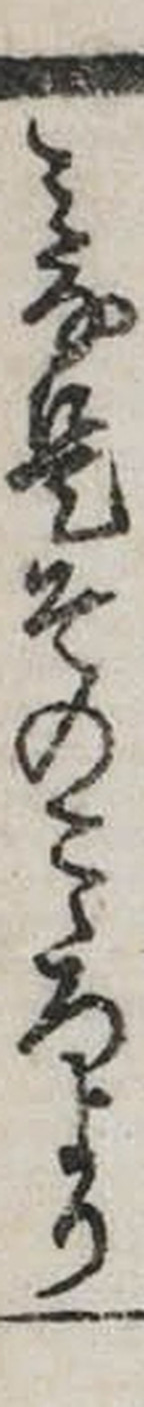みな是そのこゝろより

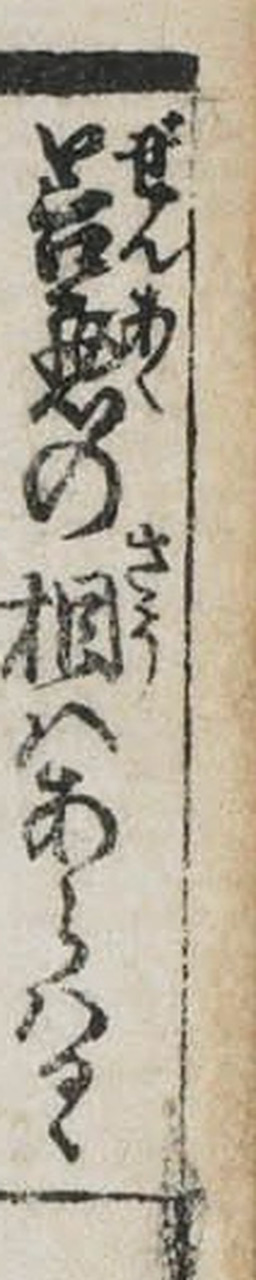善悪の相はあらはるゝ
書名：頭書萬用婦人手紙之文言
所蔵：東京学芸大学教育コンテンツアーカイブ
